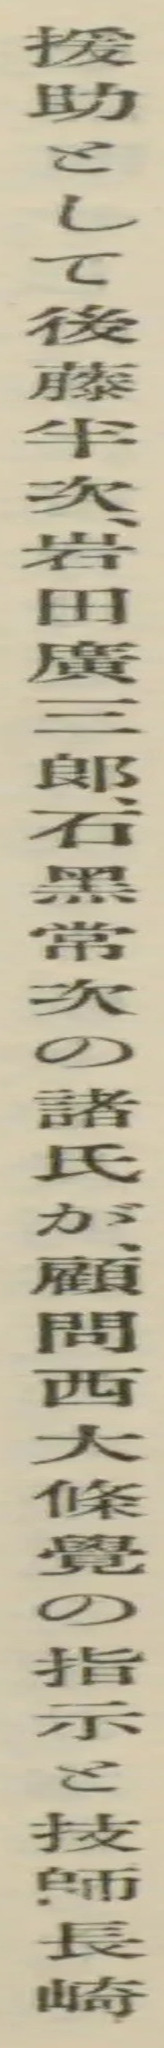援助として後藤半次、岩田廣三郎、石黒常次の諸氏が、こも顧問西大條覺の指示と技師長崎
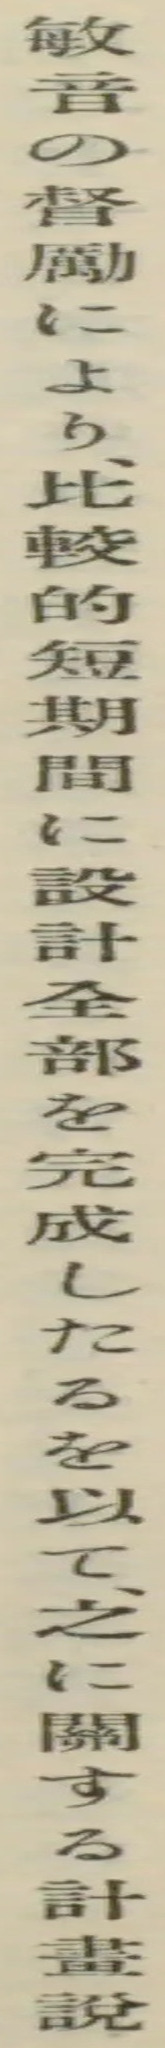敏音の督励により、比較的短期間に設計全部を完成したるを以て、之に関する計画説
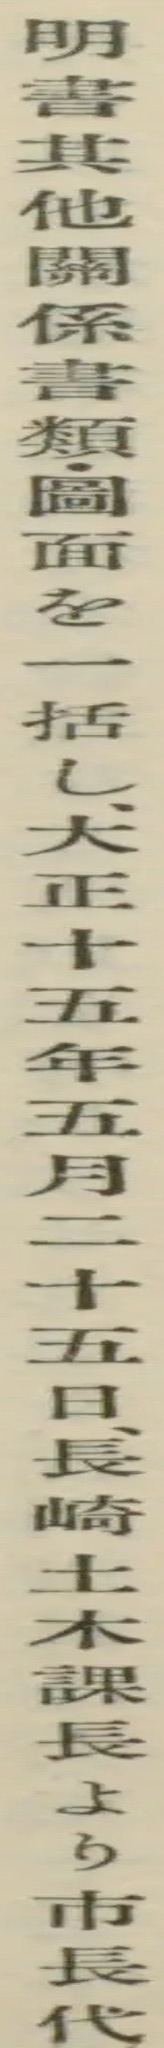明書其他関係書類・図面を一括し、大正十五年五月二十五日、長崎土木課長より市長代
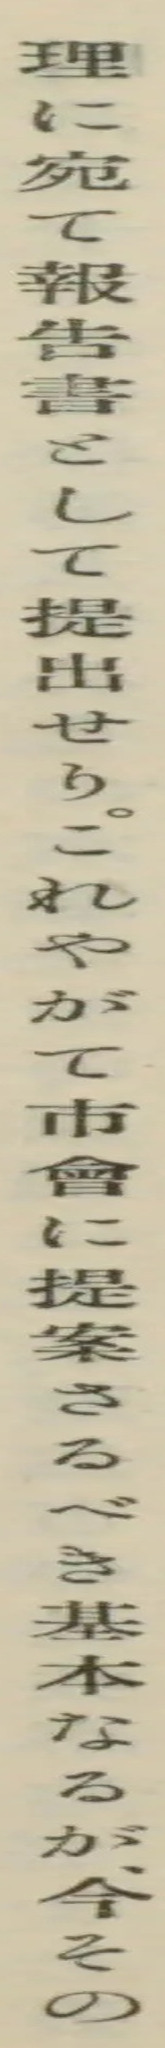理に宛て報告書として提出せり。これやがて市会に提案さるべき基本なるが、今その
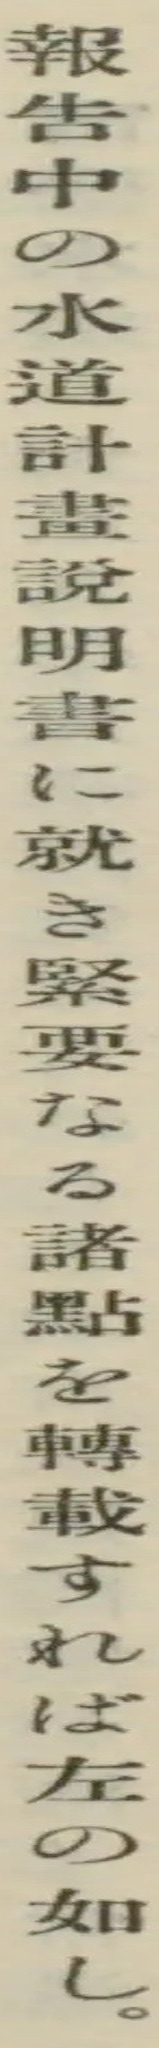報告中の水道計画説明書に就き緊要なる諸點を轉載すれば左の如し。
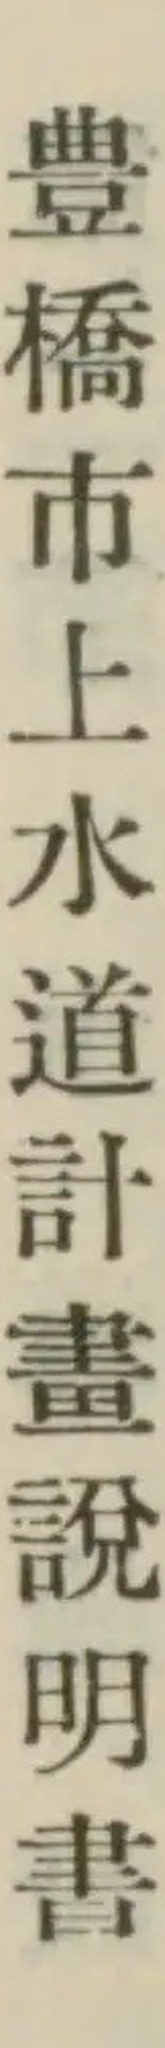豊川市上水道計画説明書
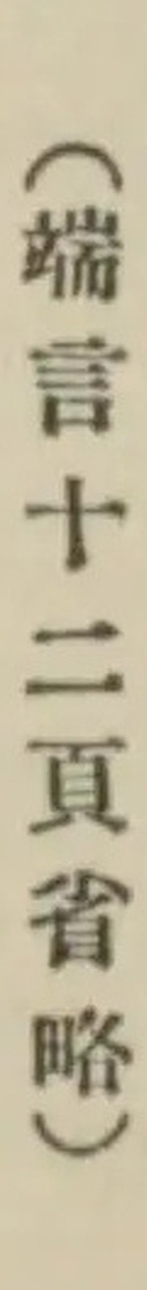(端言十二頁省略)
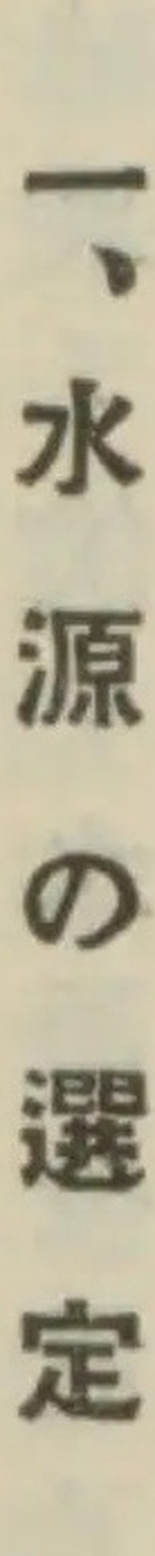一、水源の選定
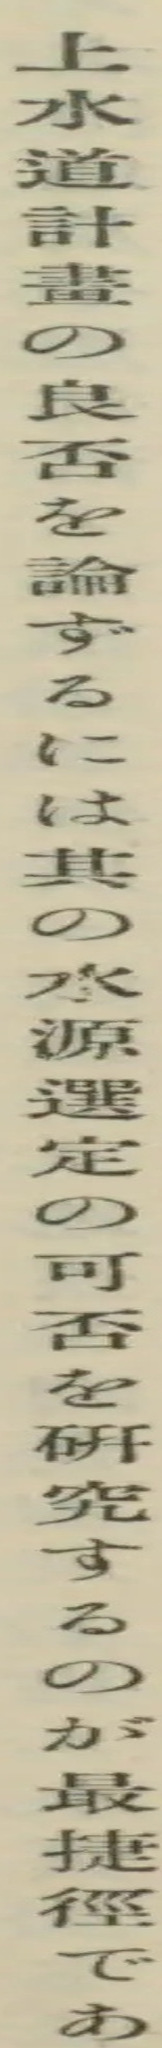上水道計画の良否を論ずるには其の水源選定の可否を研究するのが最捷徑であ
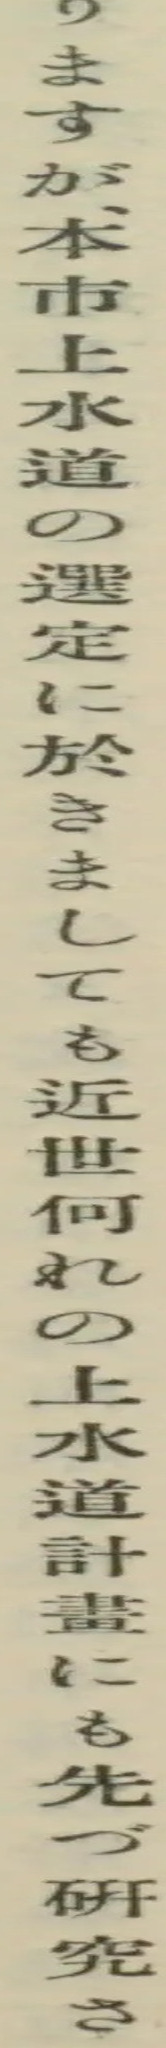りますが、本市上水道の選定に於きましても近世何れの上水道計画にも先づ研究さ
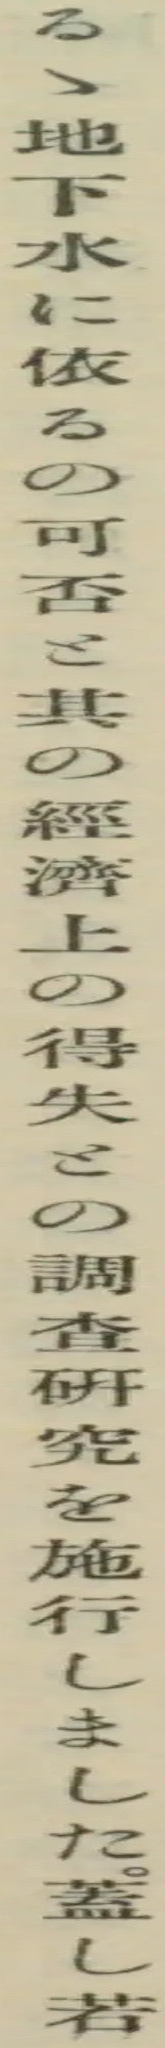るゝ地下水に依るの可否と其の経済上の得失との調査研究を施行しました。蓋し若
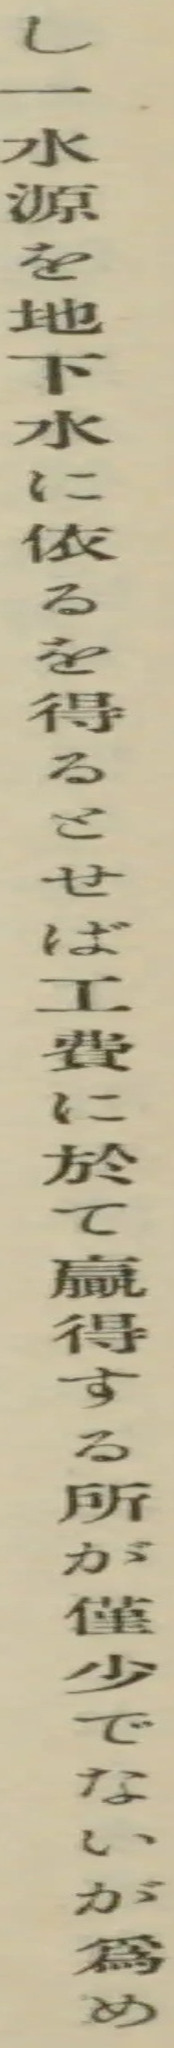し一水源を地下水に依るを得るとせば工費に於て贏得する所が僅少でないが為め
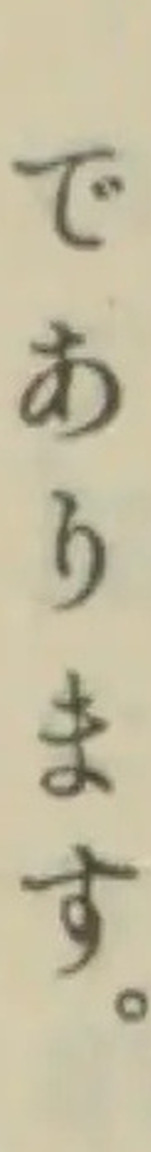であります。
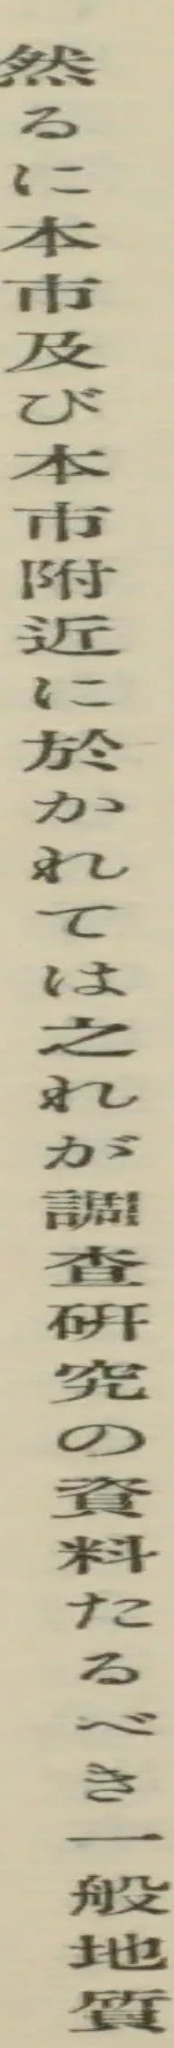然るに本市及び本市於かれては之が調査研究の資料たるべき一般地質
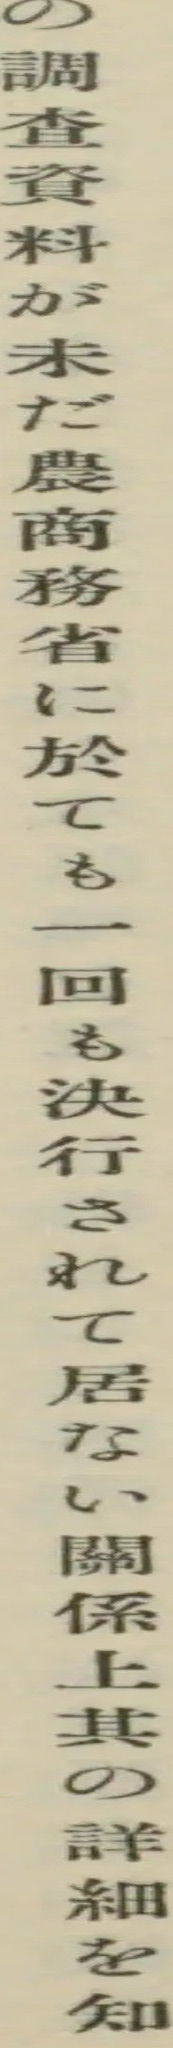の調査資料が未だ農商務省に於ても一回も決行されて居ない関係上其の詳細を知
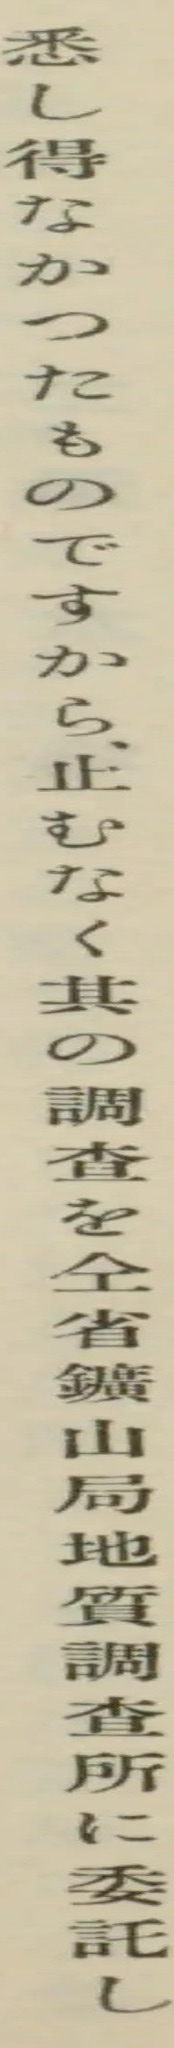悉しえなかたつたものですから、止むなく其の調査を同省鉱山局地地質調査所に委託し
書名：豊橋市水道誌
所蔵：国立国会図書館 National Diet Library, JAPAN
